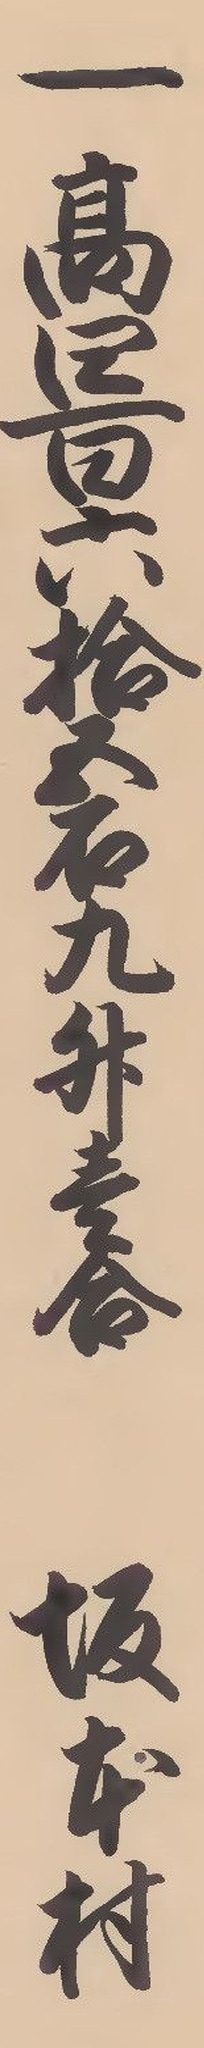一高四百六拾五石九升壱合坂本村
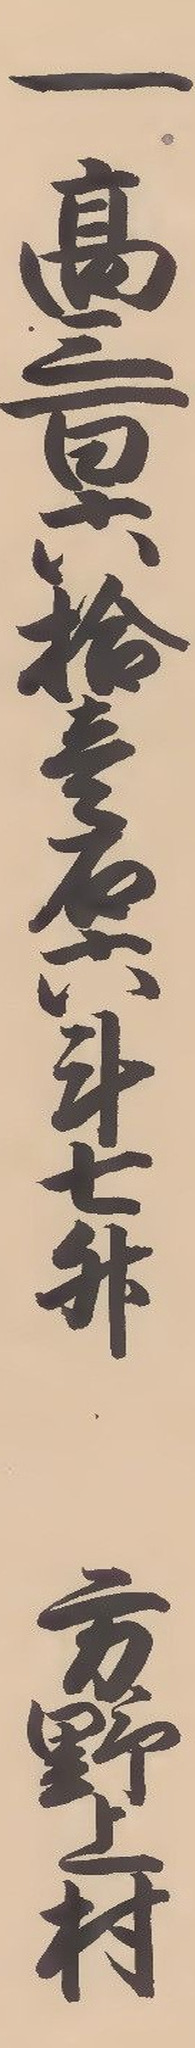一高三百六拾壱石六斗七升方野上村
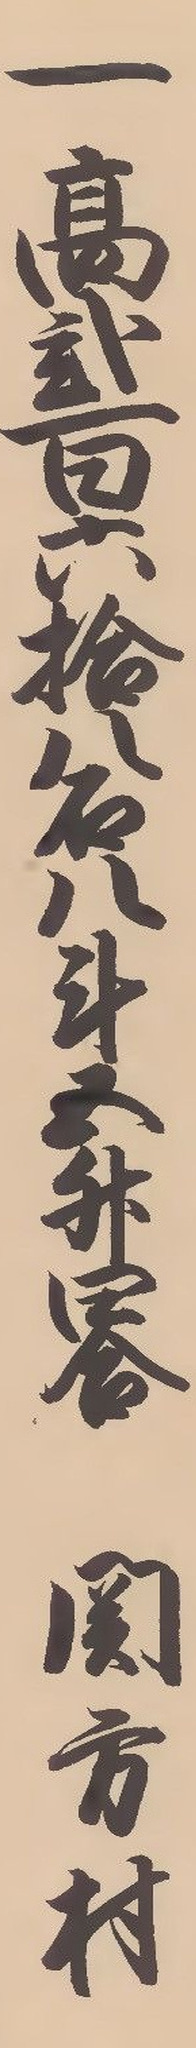一高弐百六拾八石八斗五升四合関方村
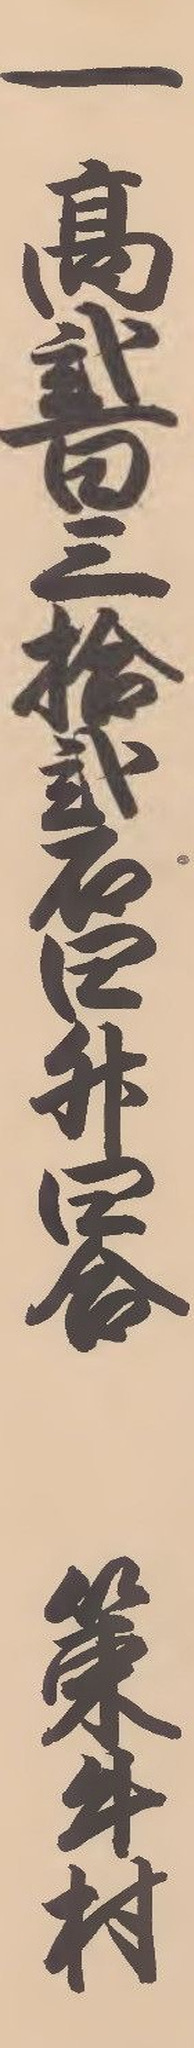一高弐百三拾弐石四升四合策牛村
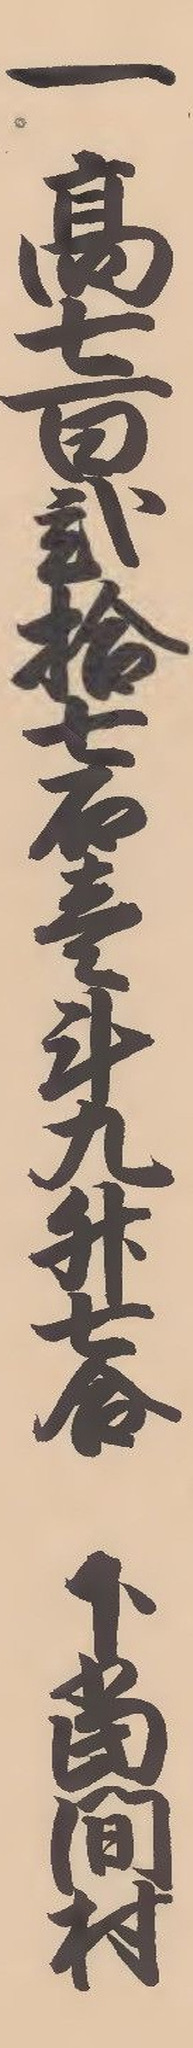一高七百弐拾七石壱斗九升七合下当間村
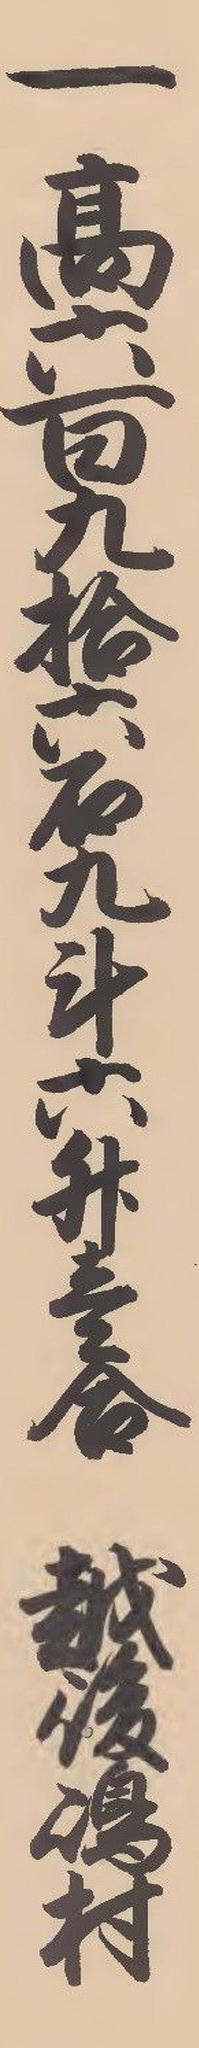一高六百九拾六石九斗六升壱合越後島村
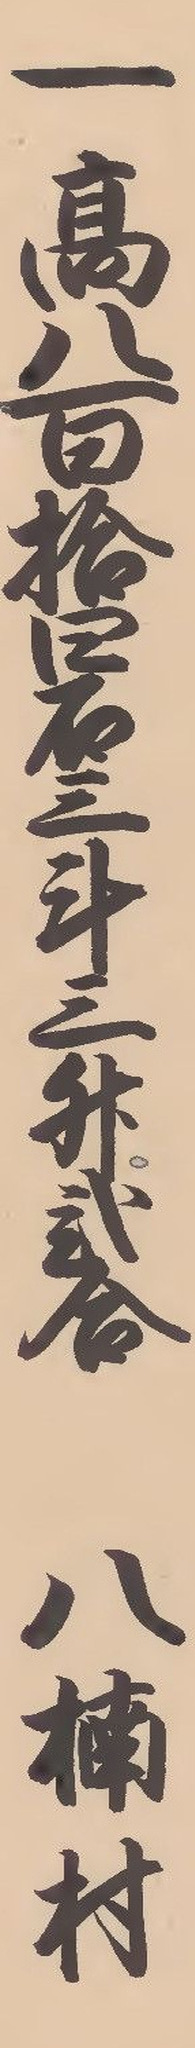一高八百拾四石三斗三升弐合八楠村

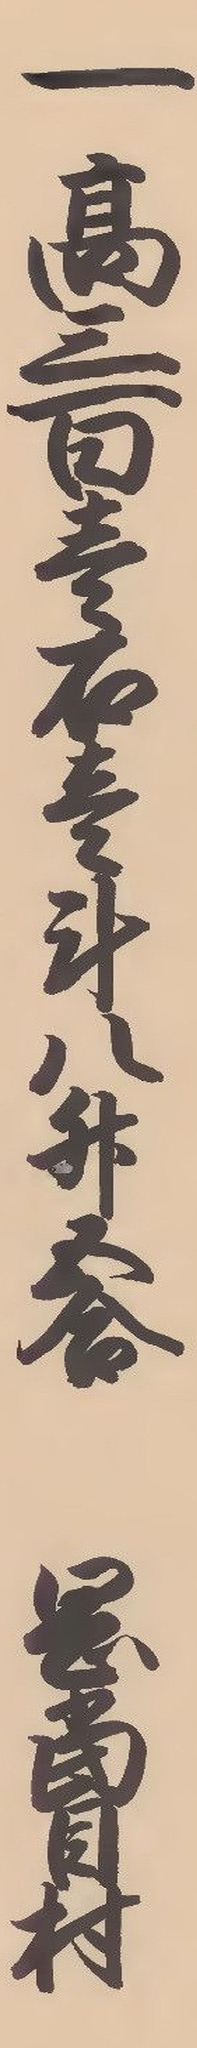一高三百壱右壱斗八升五合岡当目村
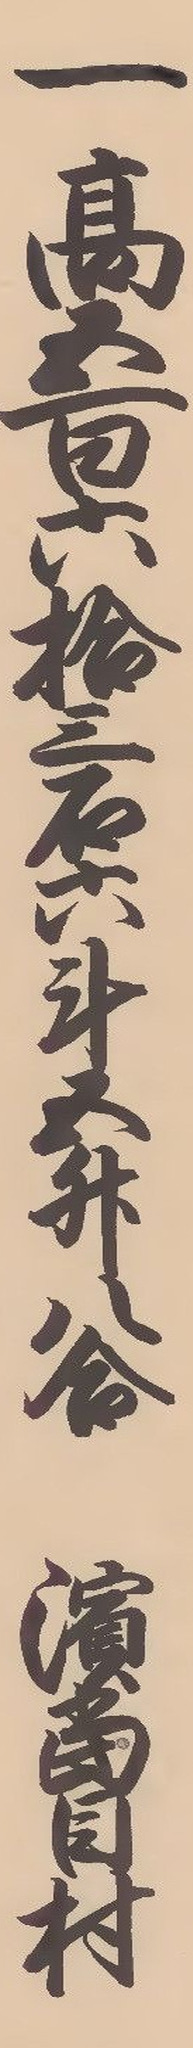一高五百六拾三石六斗五升八合浜当目村
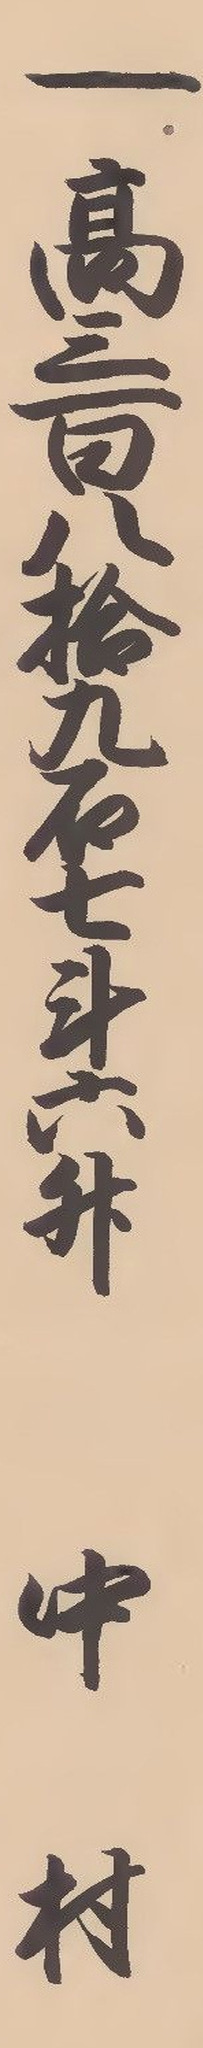一高三百八拾九石七斗六升中村
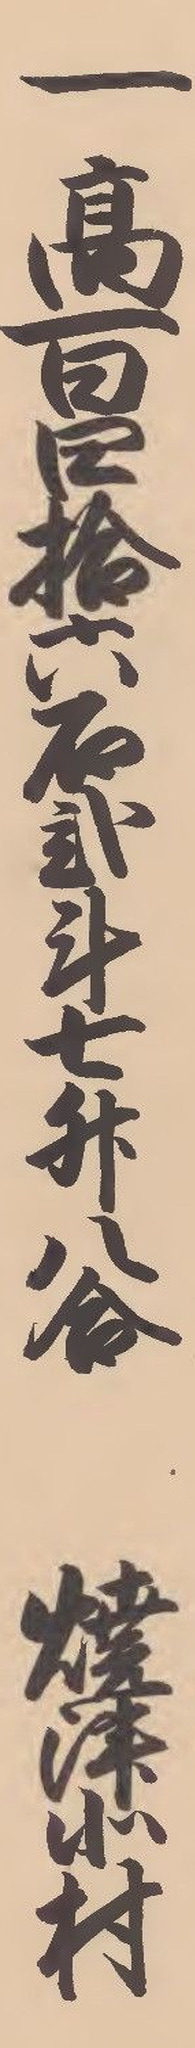一高百四拾六石弐斗七升八合焼津北村
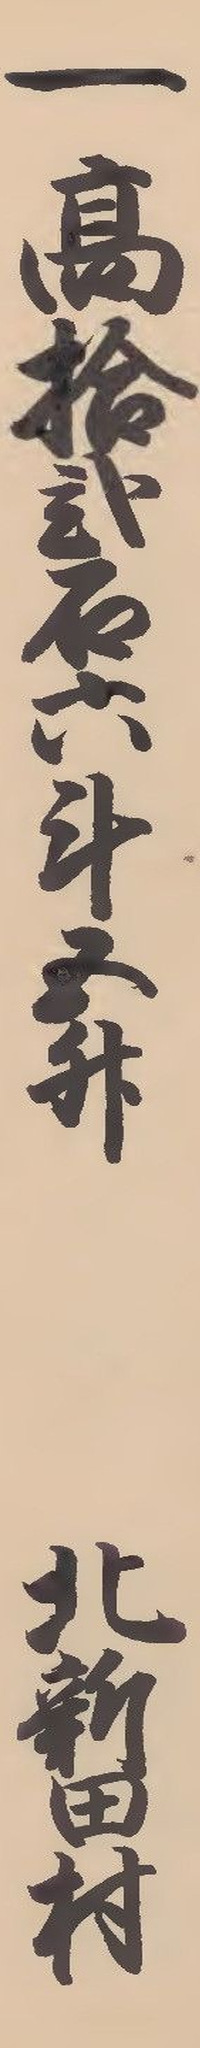一高拾弐石六斗五升北新田村
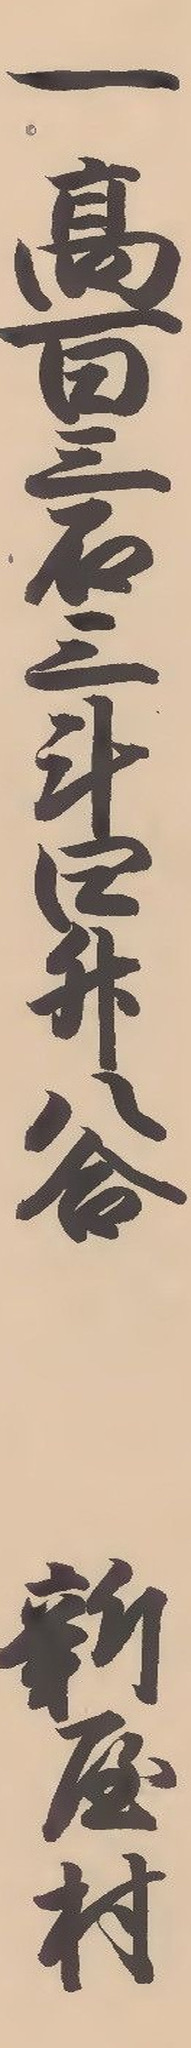一高百三石三斗四升八合新屋村
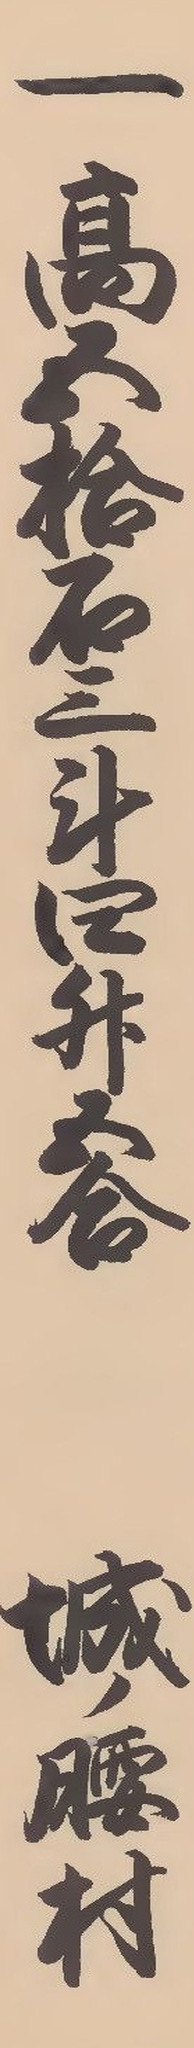一高五拾石三斗四升五合城ノ腰村
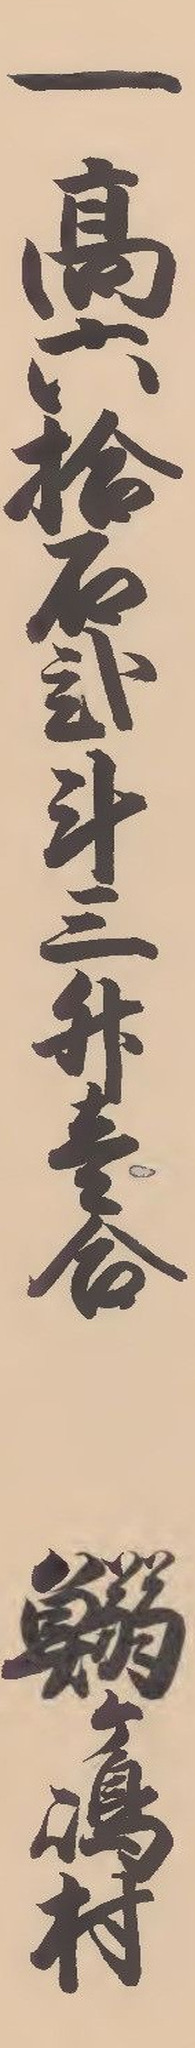一高六拾石弐斗三升壱合鰯ヶ島村

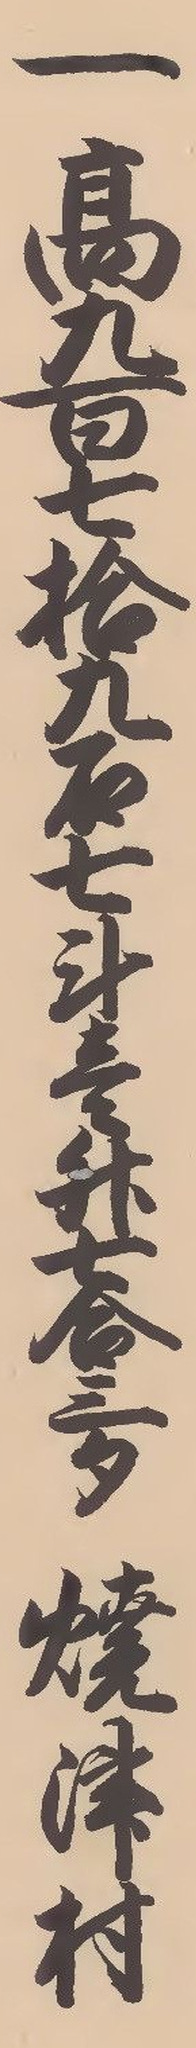一高九百七拾九石七斗壱升七合三勺焼津村
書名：駿河国郷帳
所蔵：国立公文書館 National Archives of Japan
